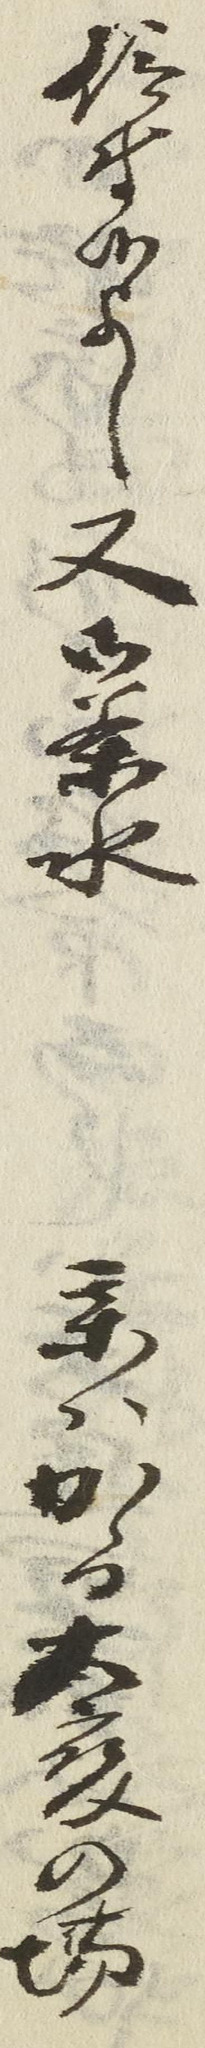仰付候よし又御茶水某はかゝる大変の場
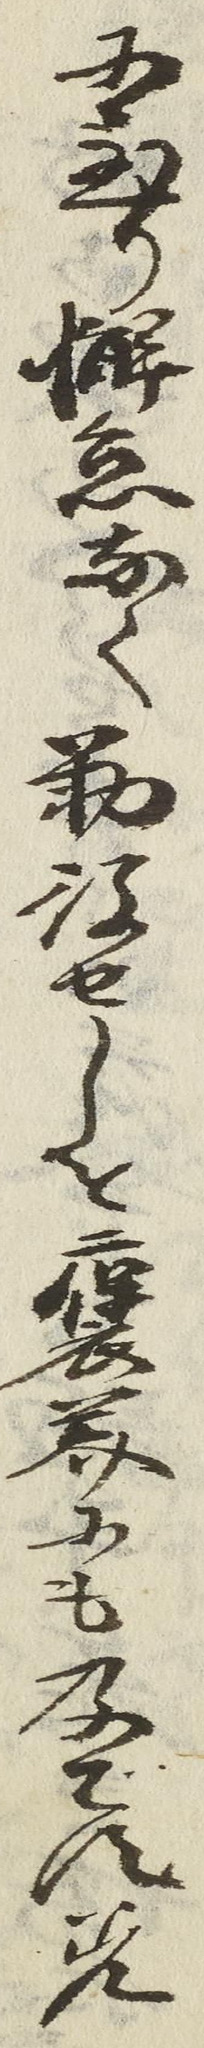に至り懈怠なく勤役せしを褒美にも及ばす差
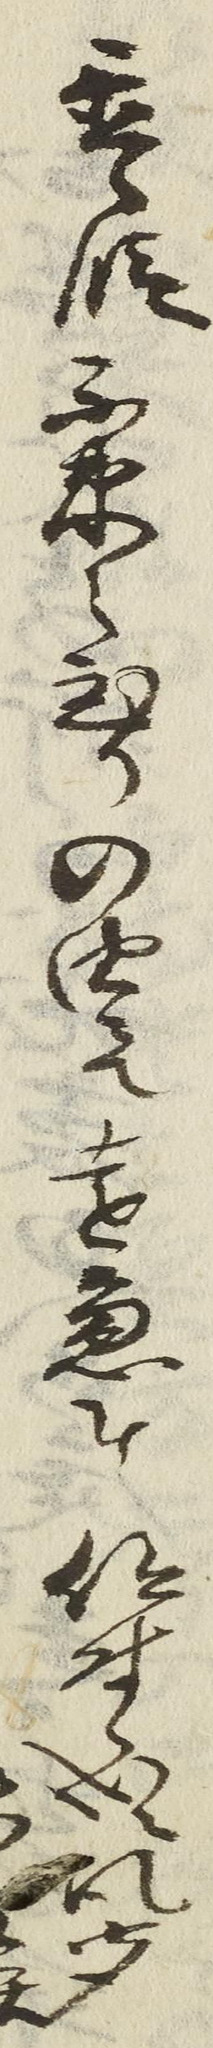置候段不束之至りの由ニて遠慮被仰付候哉ニ風聞
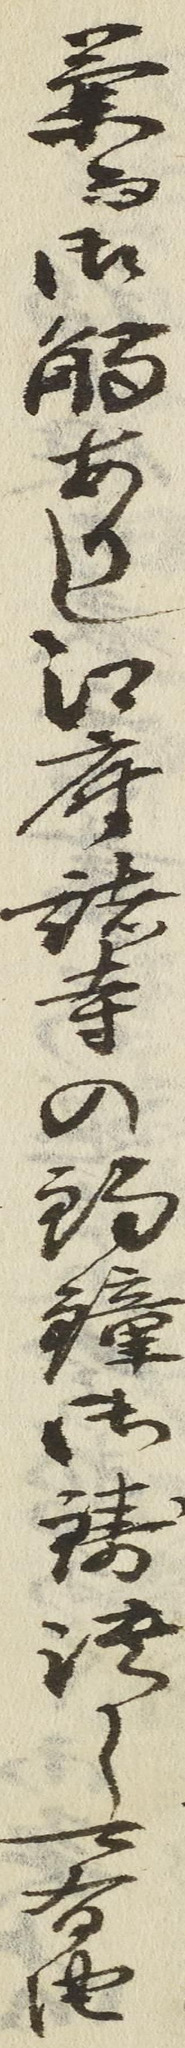兼而御触ありし江府諸寺の釣鐘御鋳潰し可有由
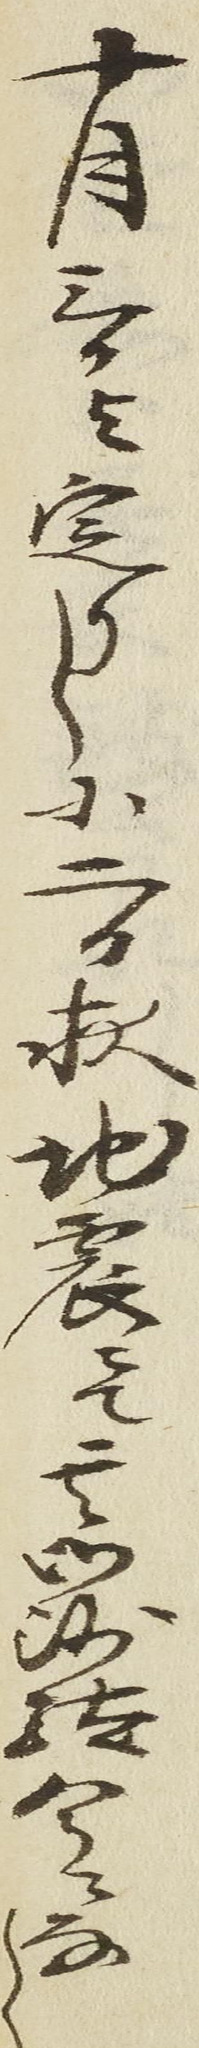十月三日与定りしに二日夜地震ニて其御沙汰今ニなし
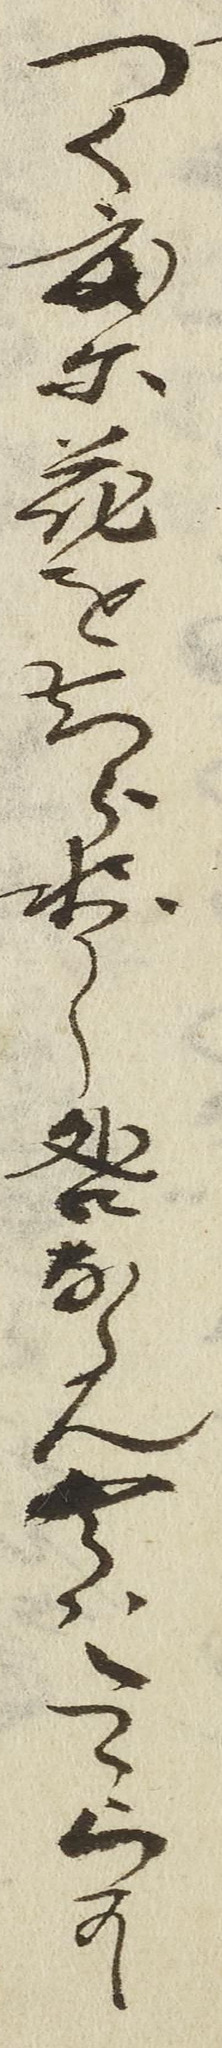つく度に花をちらせし咎ならん今はたゝらに
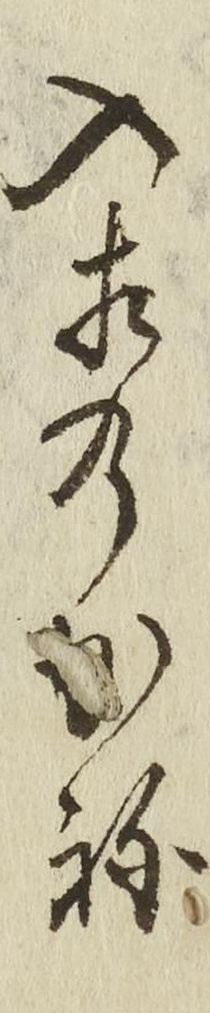入相のかね
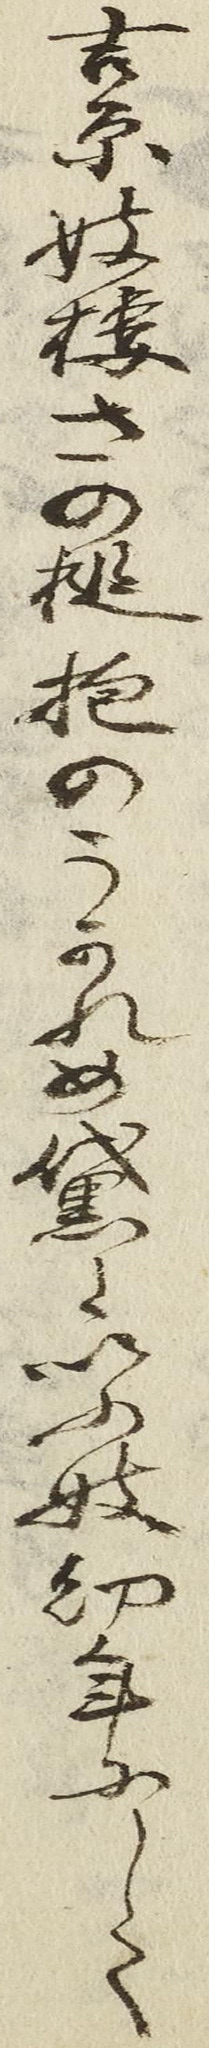吉原妓楼さの槌抱のうかれめ黛といふ妓幼年にして
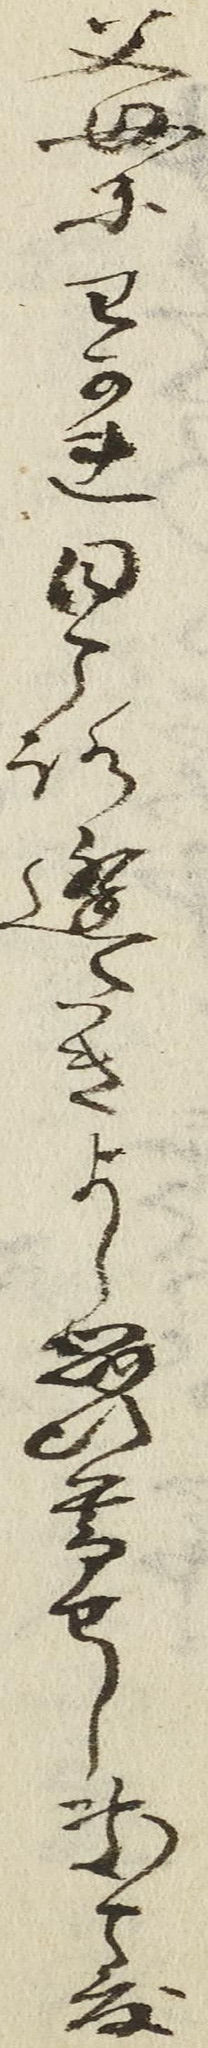父母にわかれ日ころ逢たきよし思ひ暮せし処今度
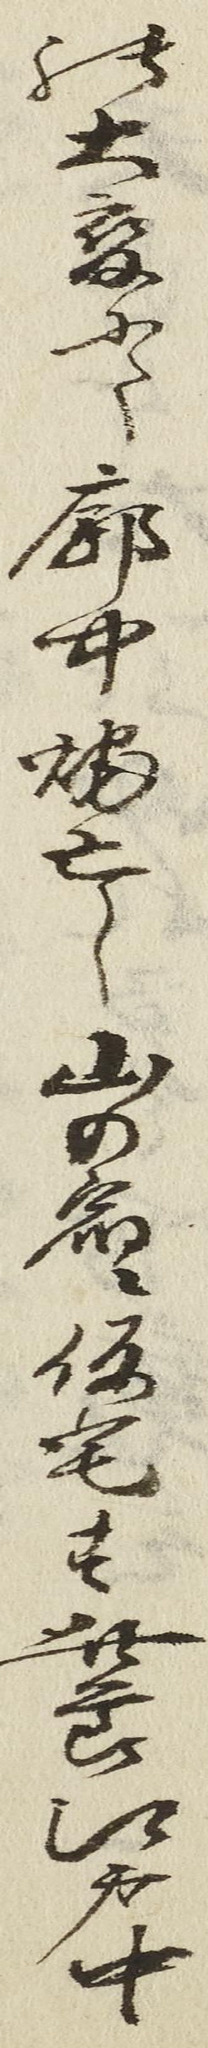の大変にて廓中焼亡し山の宿ニ仮宅す此節江戸中
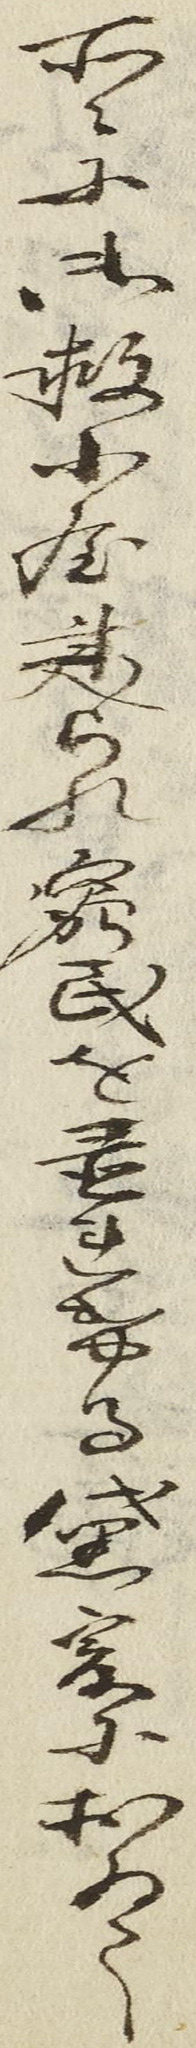所々に御救小屋建られ窮民を置れける黛爰におゐて
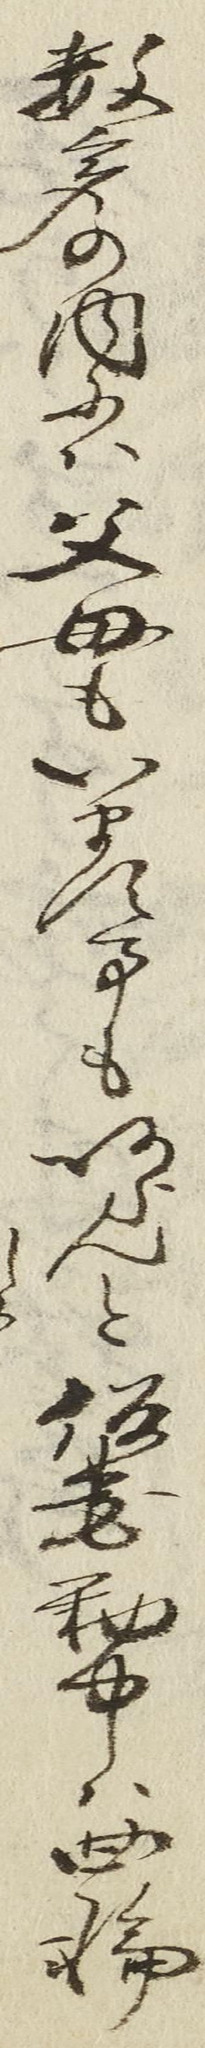数多の内には父母もいます事もあらんと仮宅勤中は曲輪
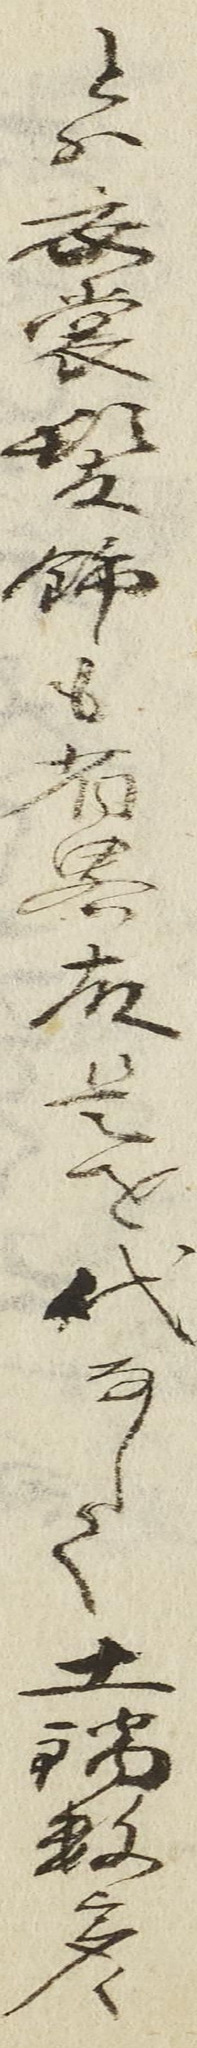とは衣裳髪飾も省略故是を代なして土鍋数多く
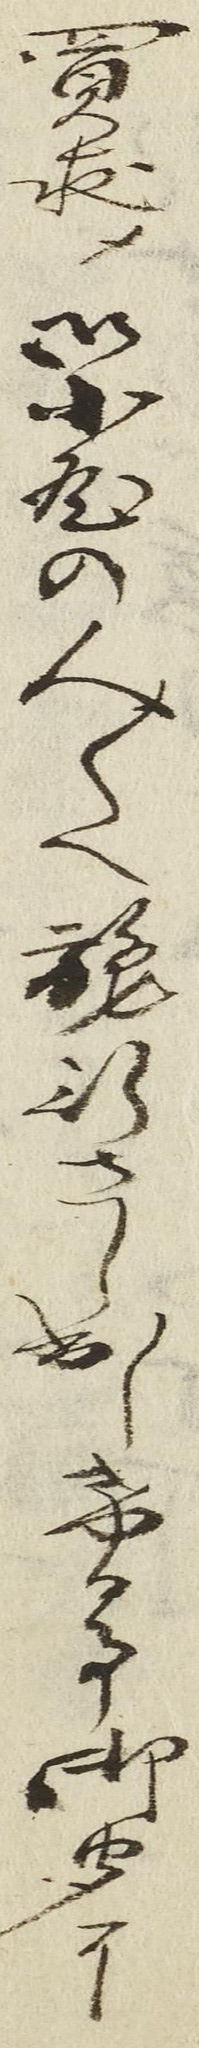買求メ御小屋の人々へ施行さし出しける事御聞に
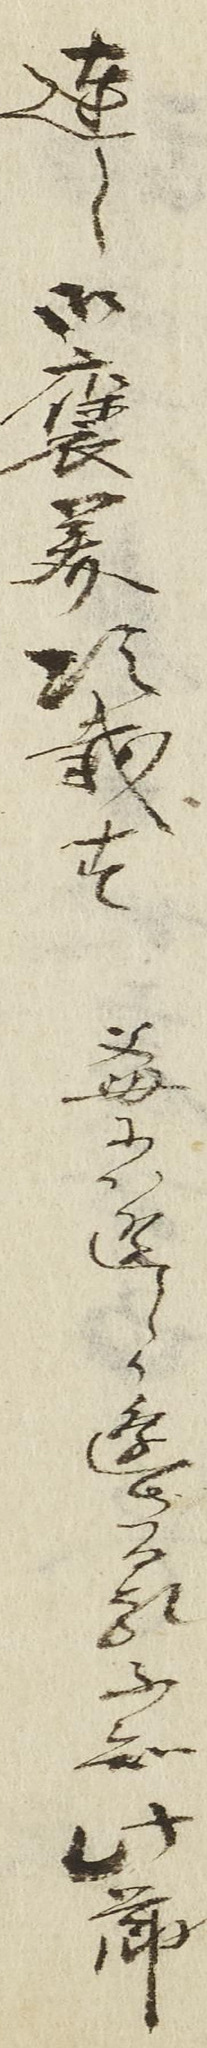達し尾褒美頂戴す父母には逢しか逢さる歟不知此節
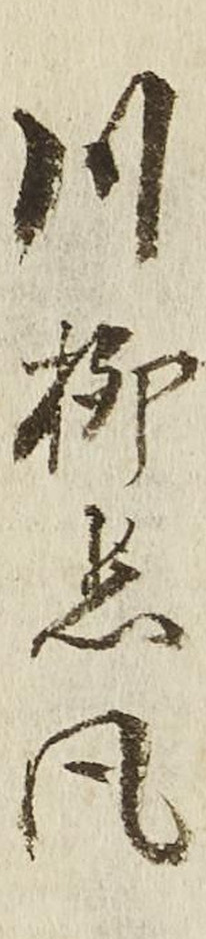川柳愚風
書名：安政二年震災記事　完
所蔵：東京大学地震研究所図書室 Earthquake Research Institute Library, The University of Tokyo, JAPAN
